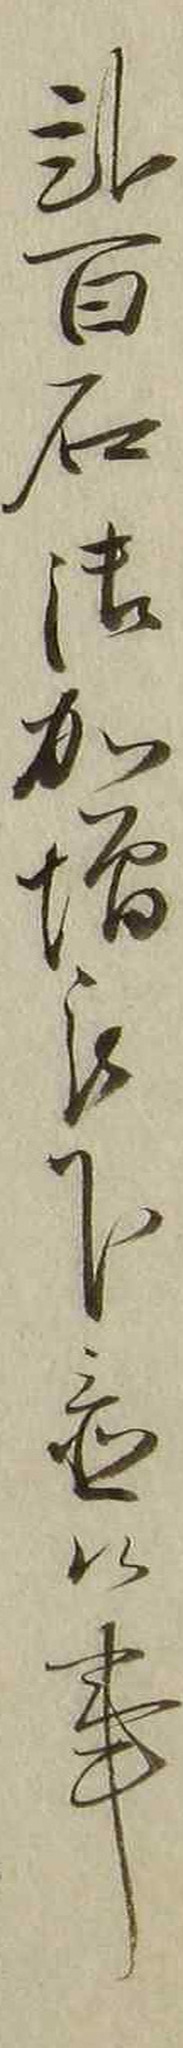弐百石御加増被下置候事
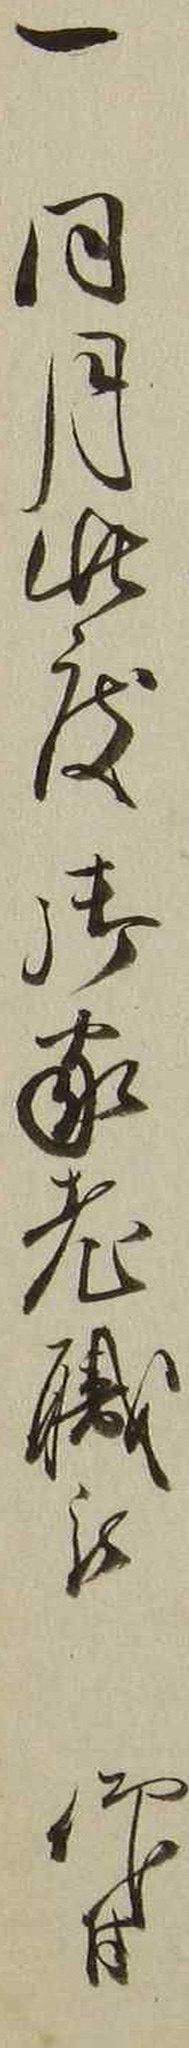一同月此度御家老職被仰付
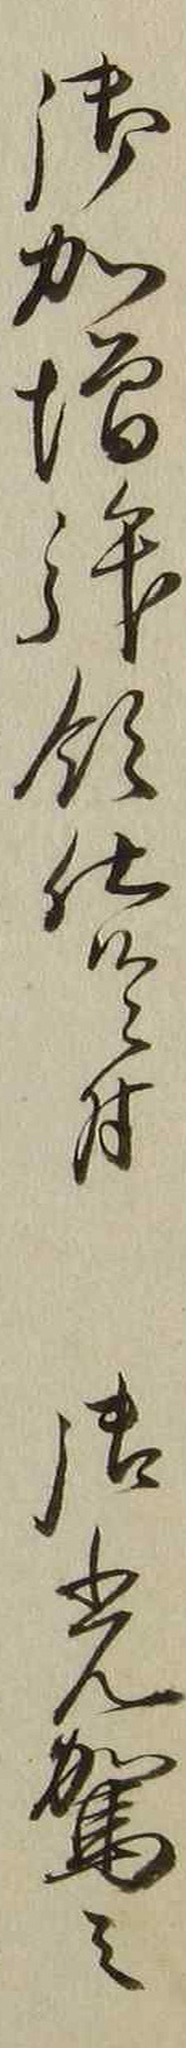御加増拝領仕候に付御光駕之
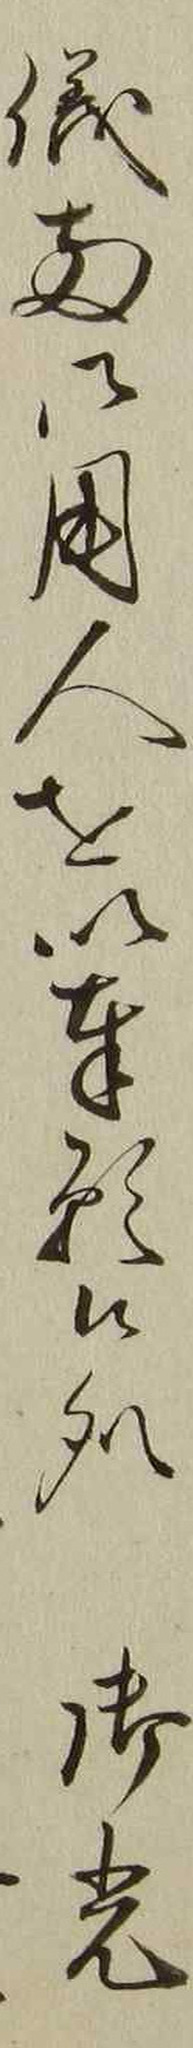儀両御用人を以奉願候処御光
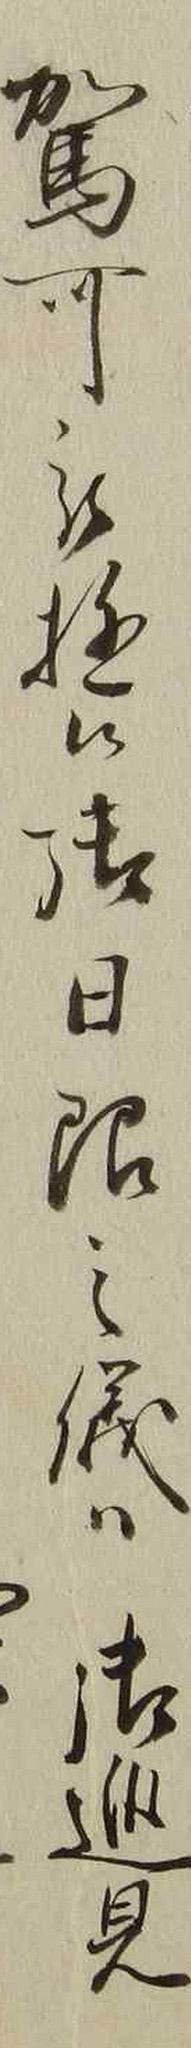駕可被遊侯御日限之儀は御巡見
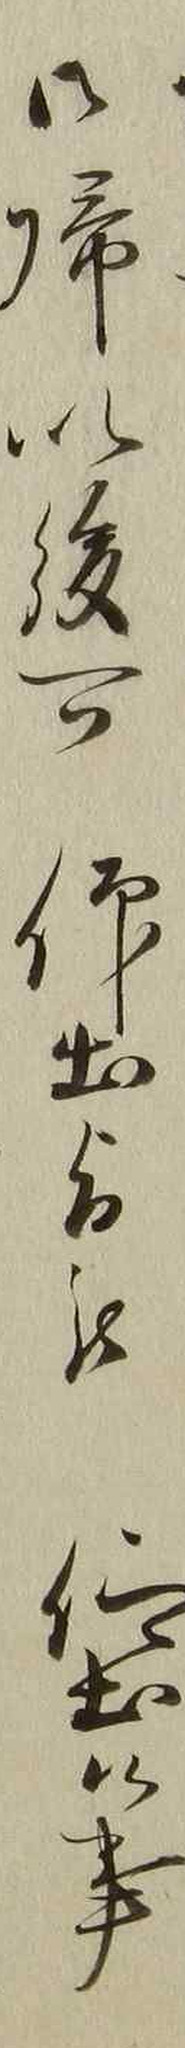御帰以後可仰出旨被仰出候事
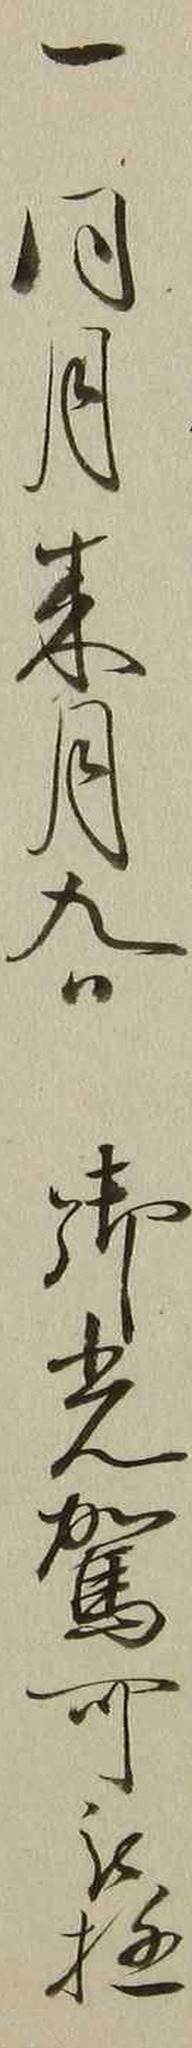一同月来月九日御光駕可被遊
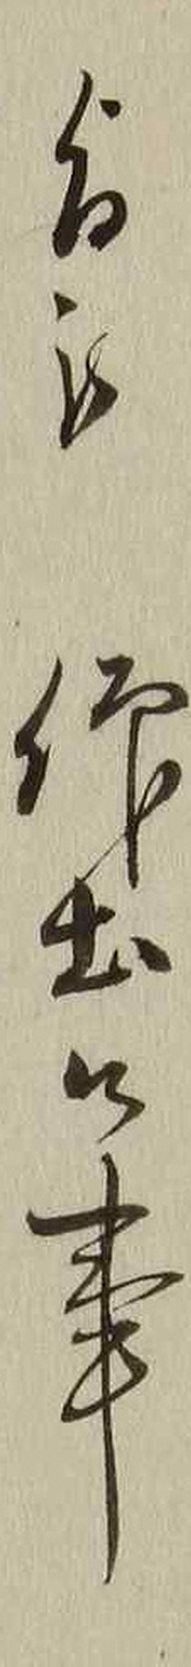旨被仰出候事
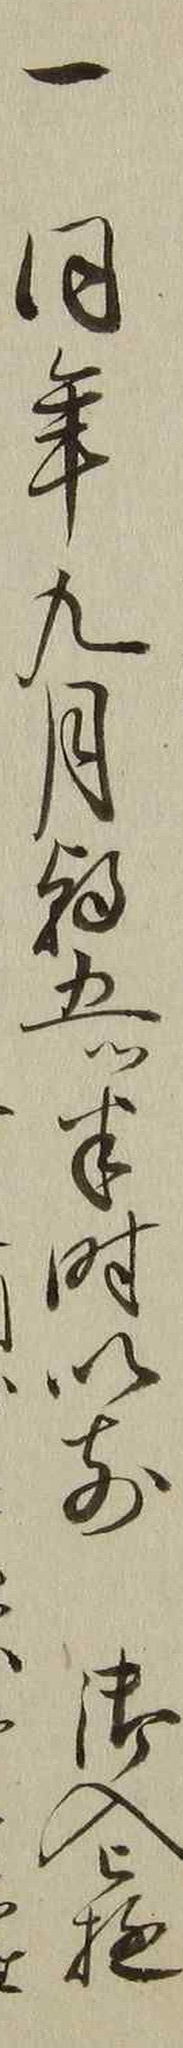一同年九月朝五半ッ半時以前御入被遊
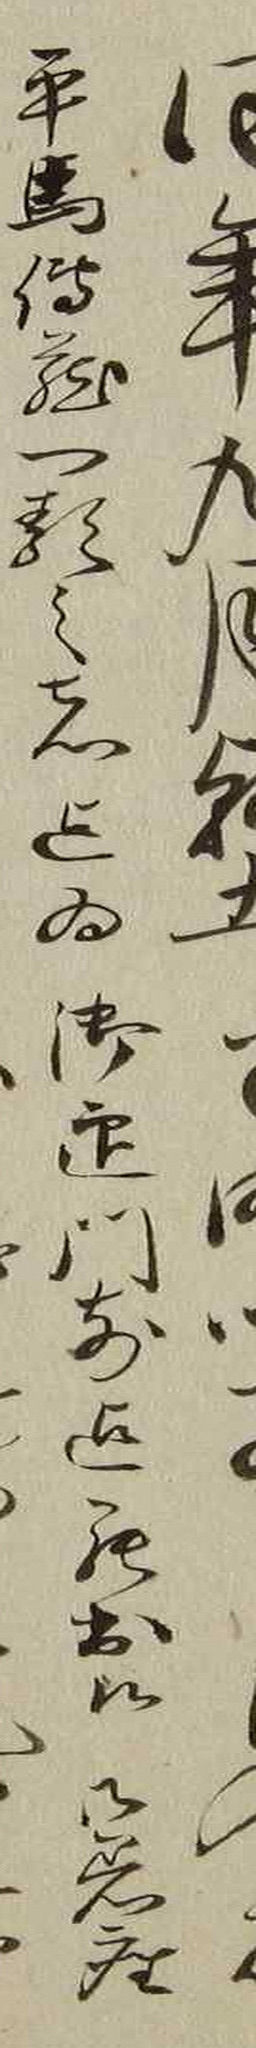平馬伝蔵一類之者迄為御迎門前迄罷出候御着座
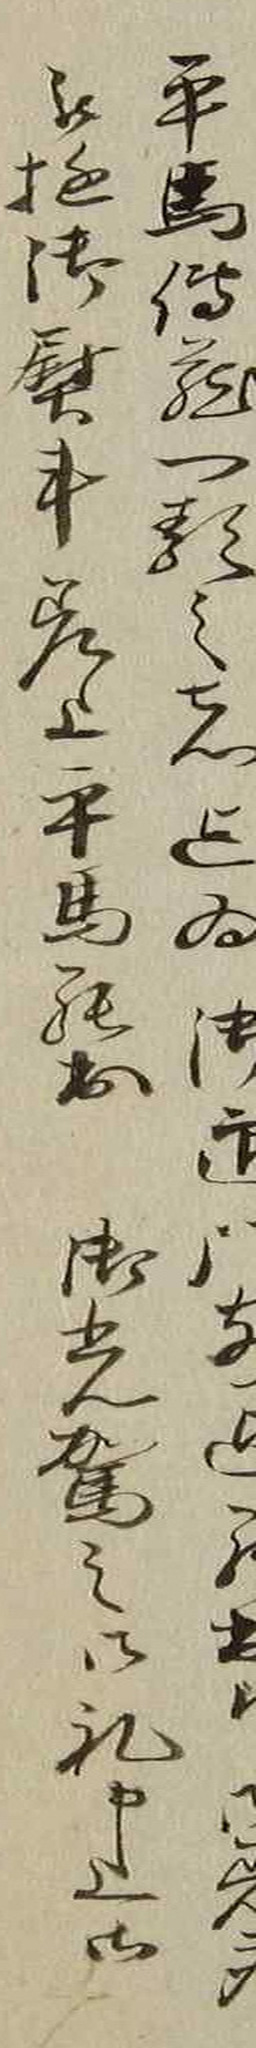被遊御熨斗差上平馬罷出御光駕之御礼申上御
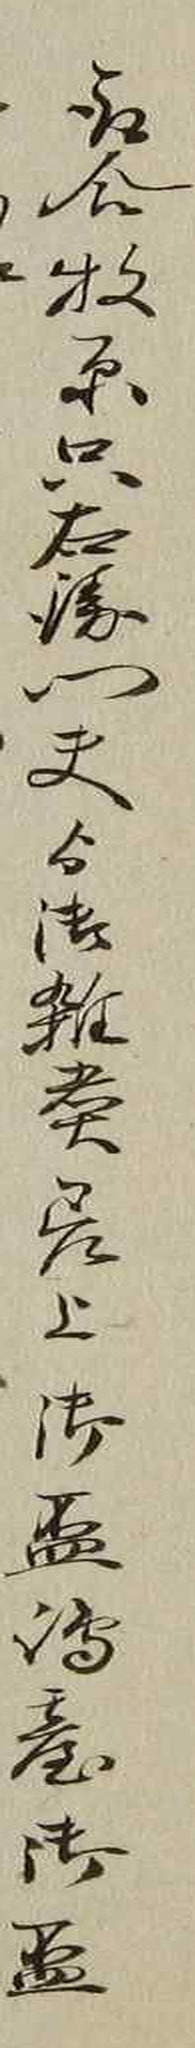取合牧原只右衛門夫ゟ御雑煮差上御盃嶋台御盃
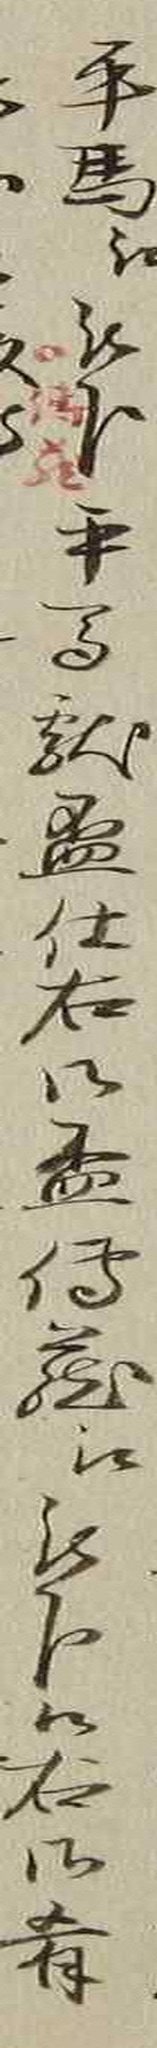平馬江被下平馬献杯仕右御盃伝蔵江被下候右御肴
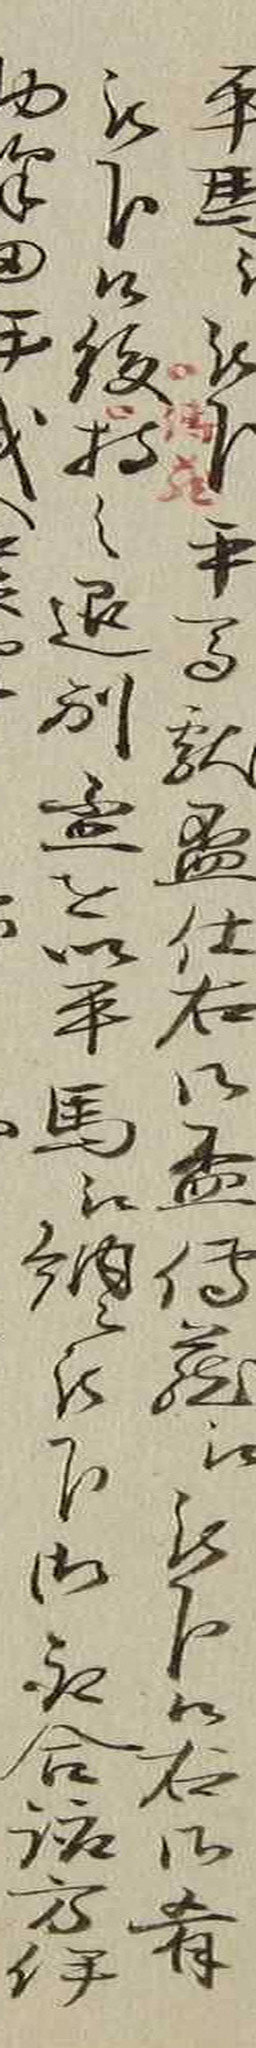被下候後伝蔵持之退列盃を以平馬江納に被下御取合諏訪伊
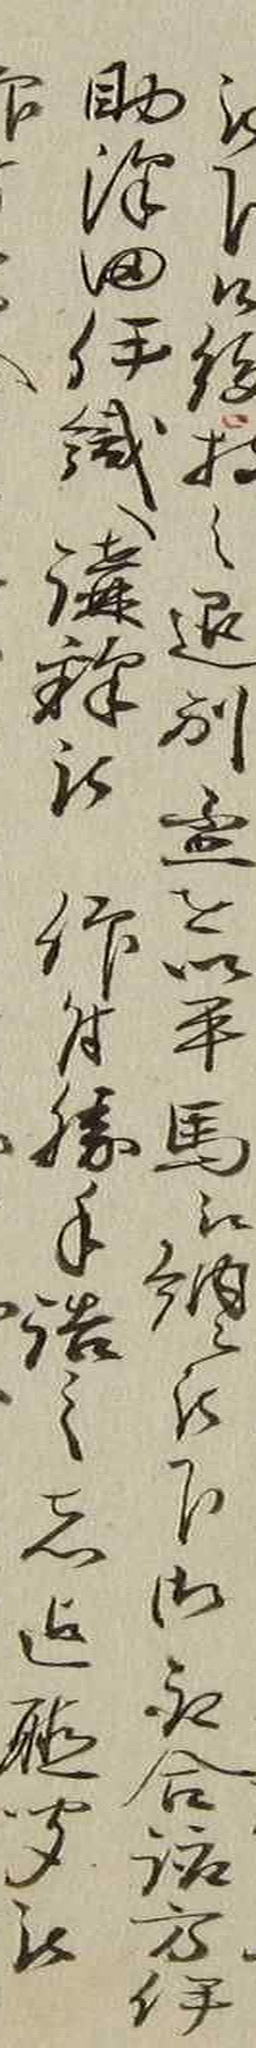助澤田伊織へ講釈被仰付勝手詰之者迄聴聞被聞
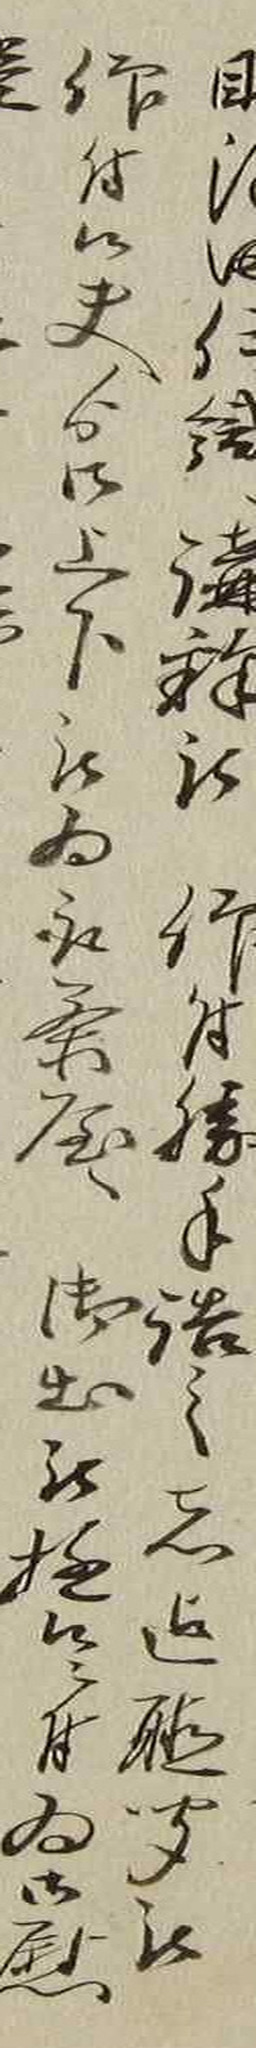仰付候夫ゟ御上下被為取茶屋へ御出被遊候に付為御慰
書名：諸士系譜　巻之103　か之部11
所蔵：会津若松市立会津図書館
